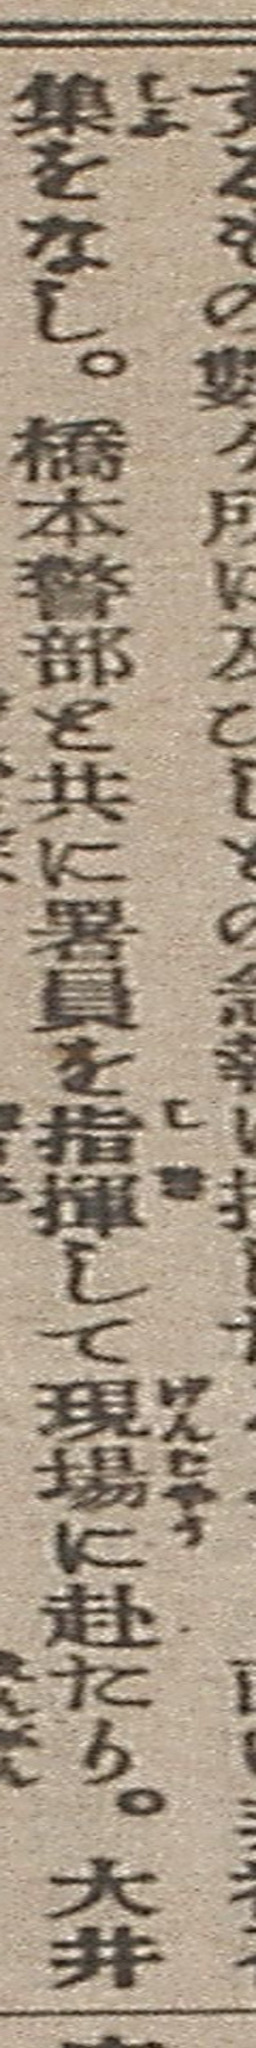集をなし。橋本警部と共に署員を指揮して現場に赴たり。大井
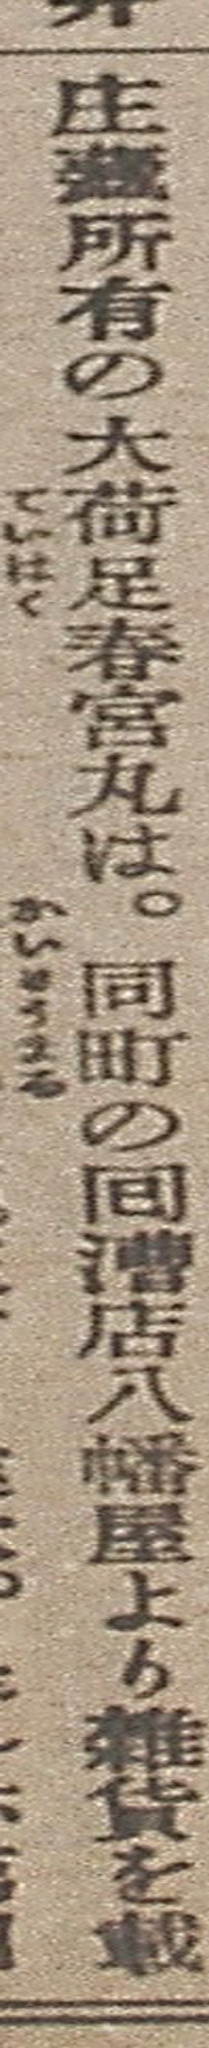庄藏所有の大荷足春宮丸は。同町の回漕店八幡屋より雑貨を載
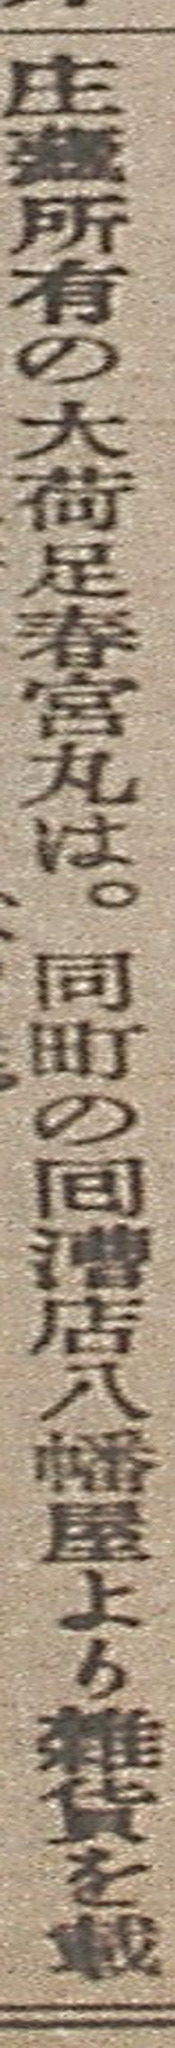庄藏所有の大荷足春宮丸は。同町の回漕店八幡屋より雑貨を載
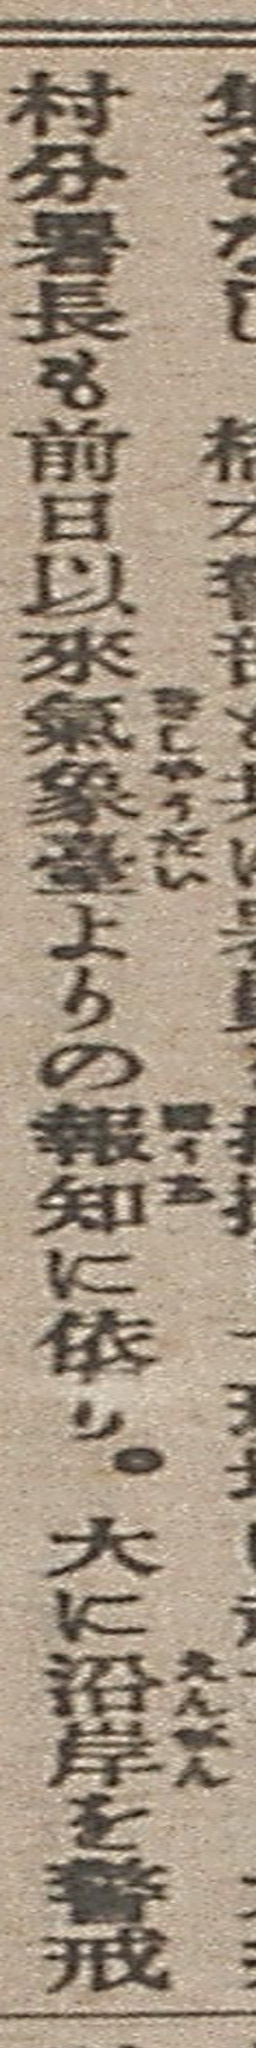村分署長も前日以来気象台よりの報知に依り。大に沿岸を警戒
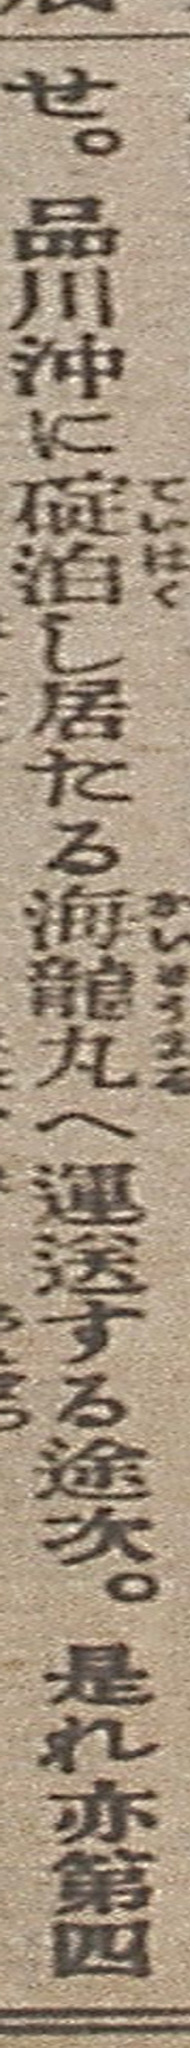せ。品川沖に碇泊し居たる海龍丸へ運送する途次。是れ亦第四
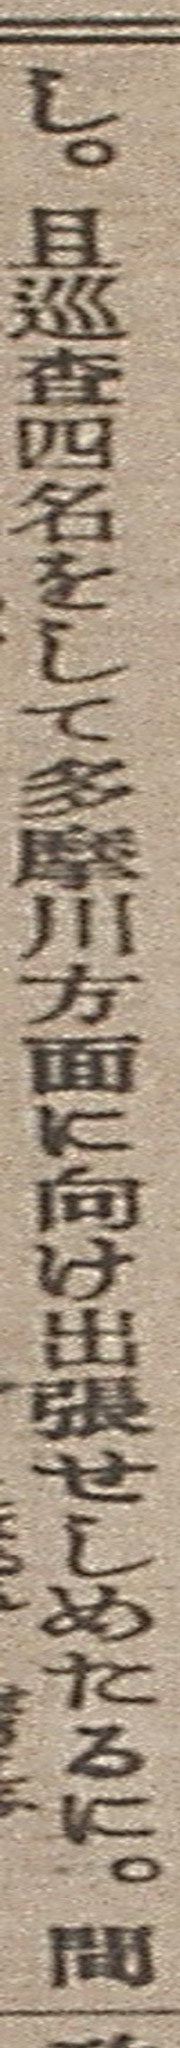し。且巡査四名をして多摩川方面に向け出張せしめたるに。間
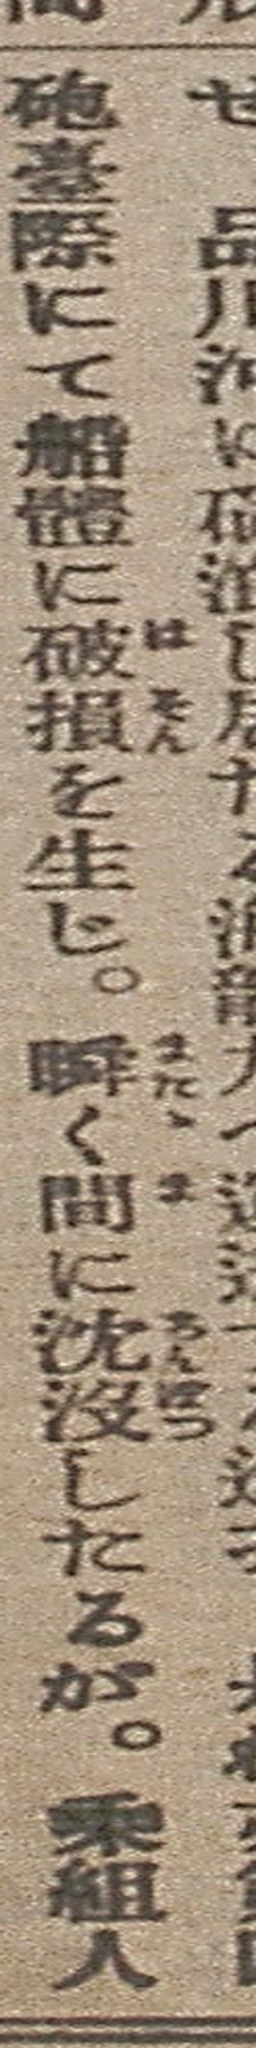砲台際にて船体に破損を生じ。瞬く間に沈没したるが。乗組員
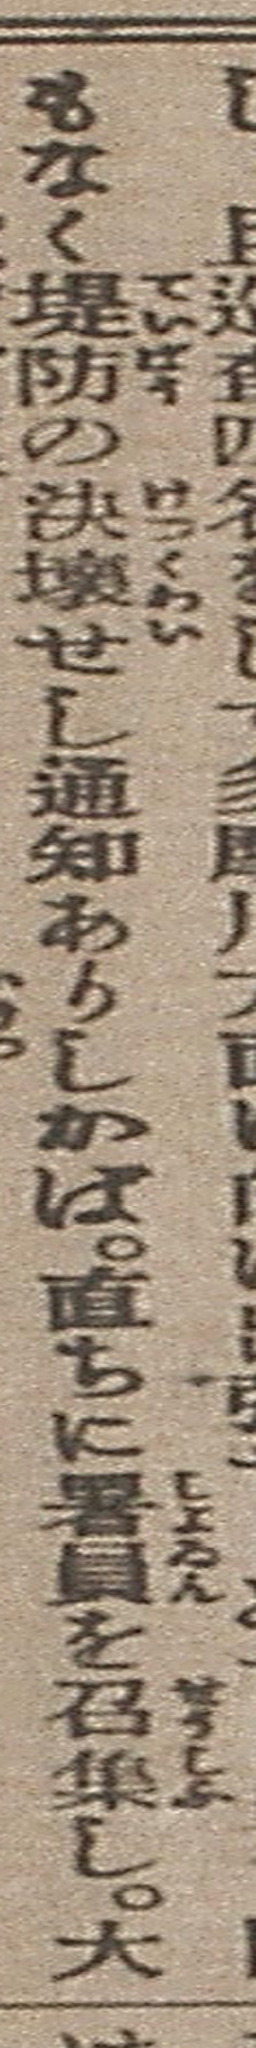もなく堤防の決壊せし通知ありしかば。直ちに署員を召集し。大
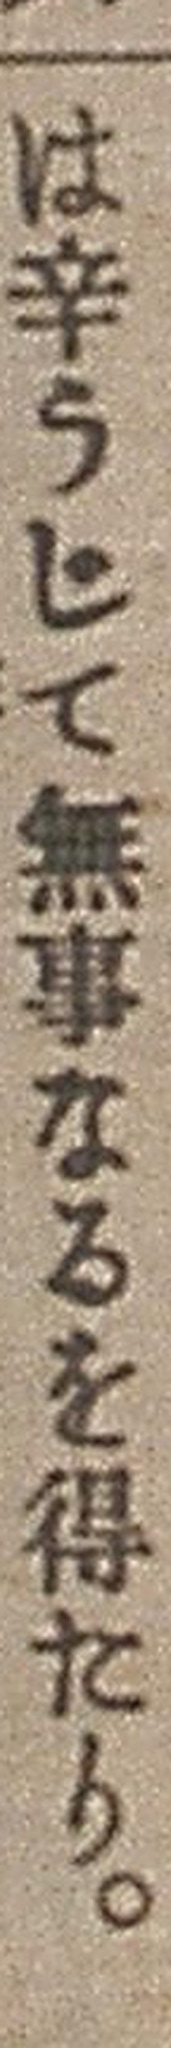は辛うじて無事なるを得たり。
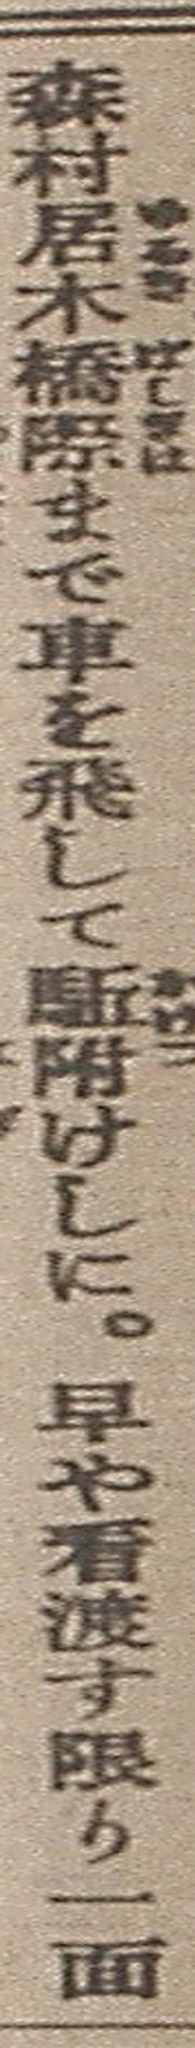森村居木橋際まで車を飛して駈付けしに。早や看渡す限り一面
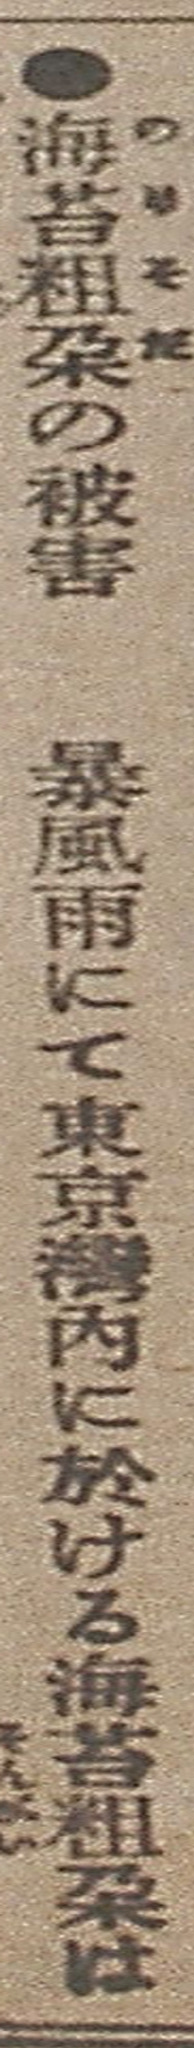●海苔粗朶の被害暴風雨にて東京湾内に於ける海苔粗朶は
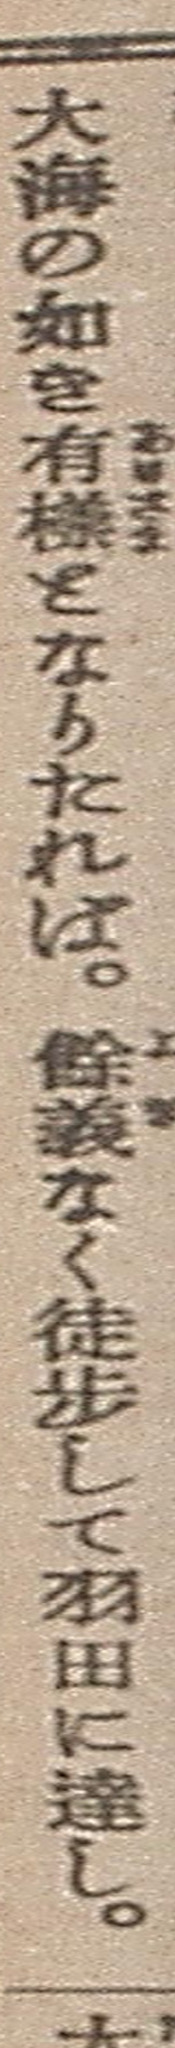大海の如き有様となりたれば。余義なく徒歩して羽田に達し。
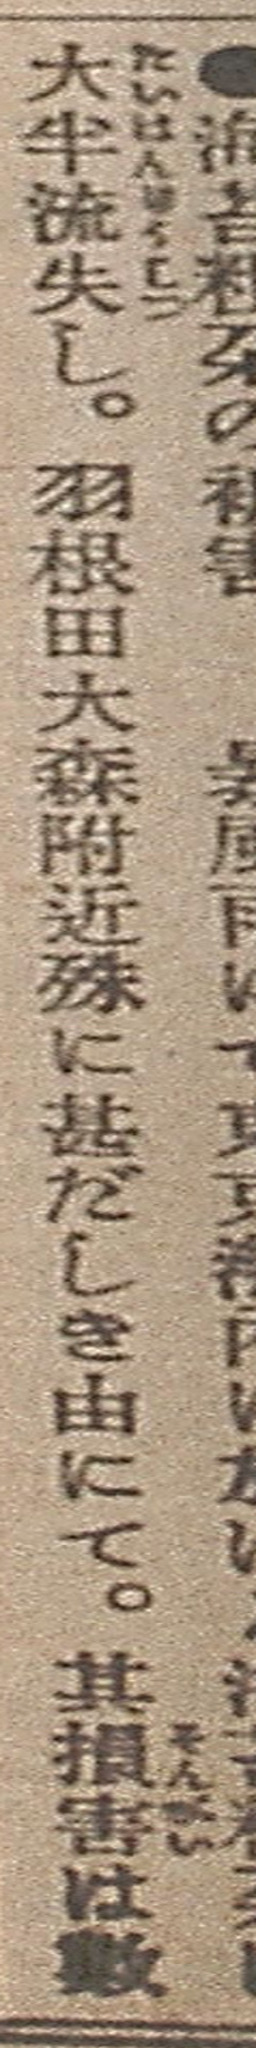大半流失し。羽根田大森付近殊に甚だしき由にて。其損害は数
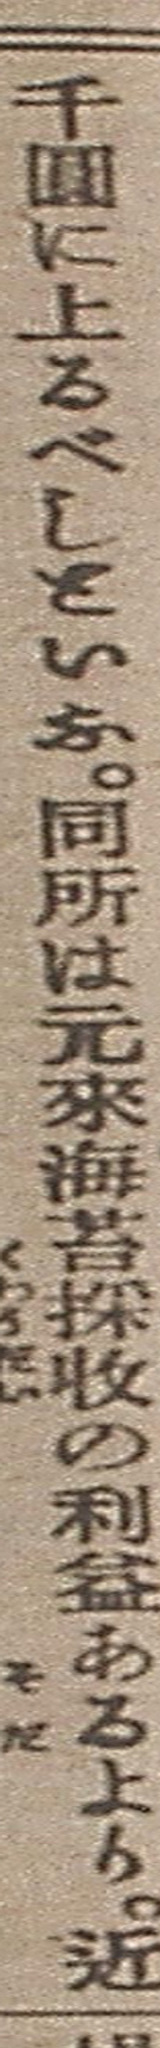千円に上るべしといふ。同所は元来海苔採収の利益あるより。近
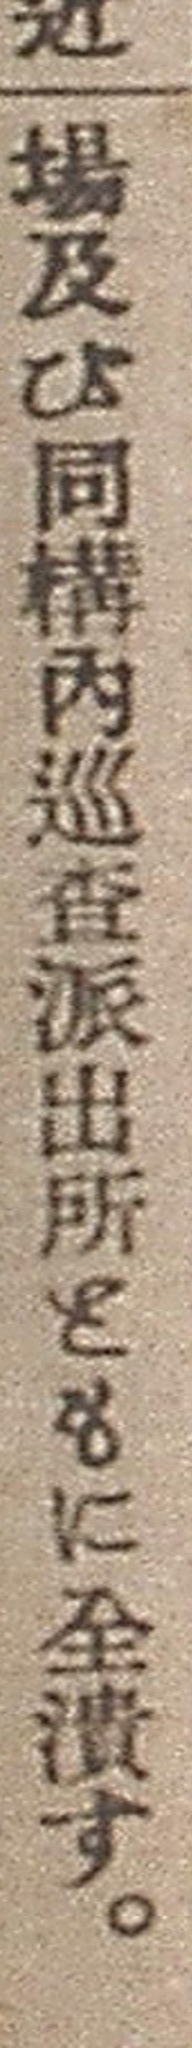場及び同構内巡査派出所ともに全潰す。
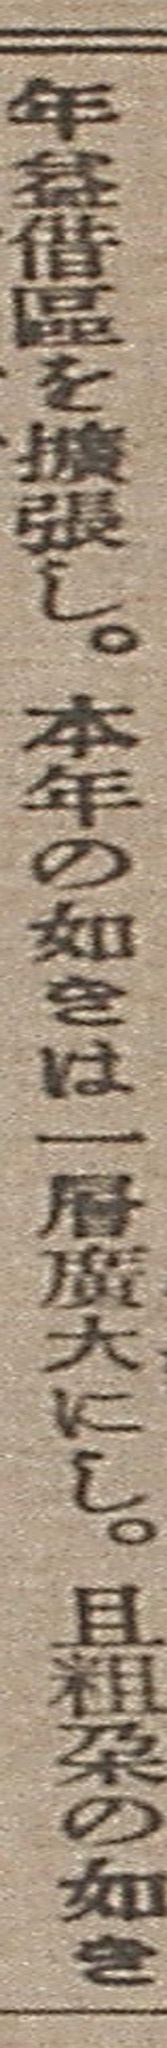年益借区を拡張し。本年の如きは一層広大にし。且粗朶の如き
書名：風俗畫報臨時増刊第百九十九號　明治三十二年十月各地災害圖會（前編之續）
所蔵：東京大学地震研究所図書室 Earthquake Research Institute Library, The University of Tokyo, JAPAN
